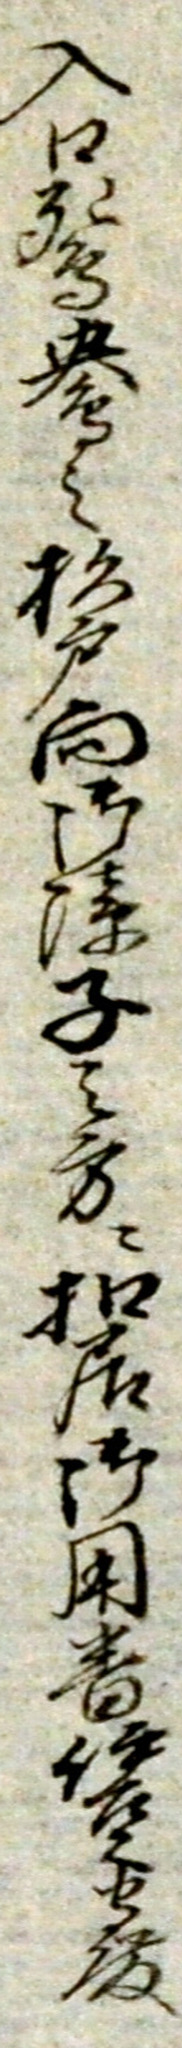入口鴛鴦之杉戸向御障子之方ニ扣居御用番伊豆守殿
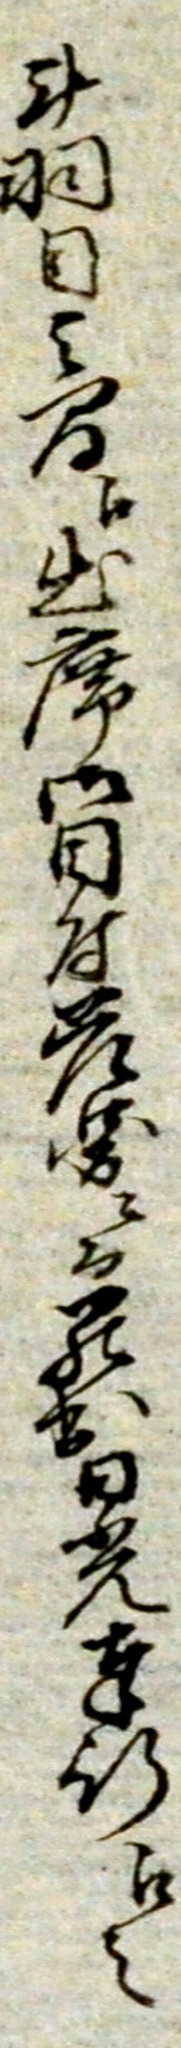斗羽目之間江出席御目付差図ニ而罷出日光奉行江者奉書
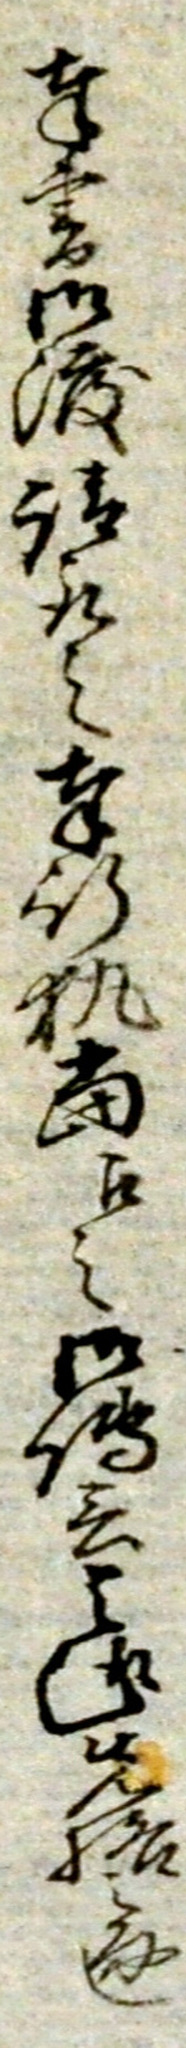御渡請取之奉行執當江之御傳言之趣先格之通
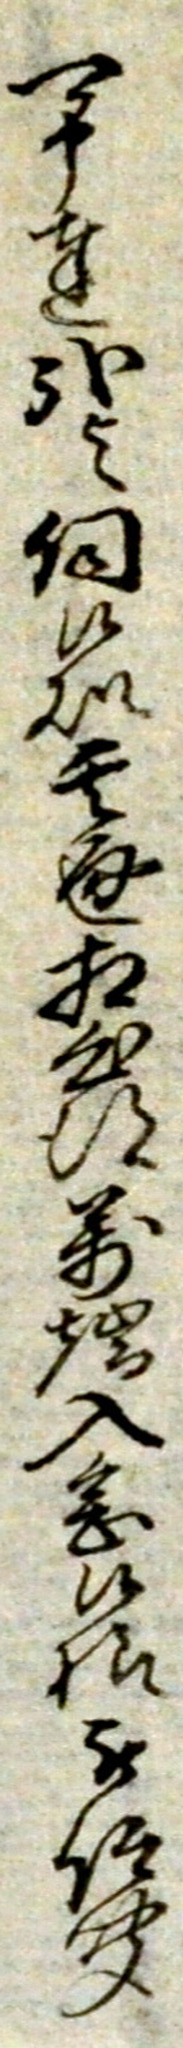可申達哉と伺候処其通相心得万端入念候様被仰聞
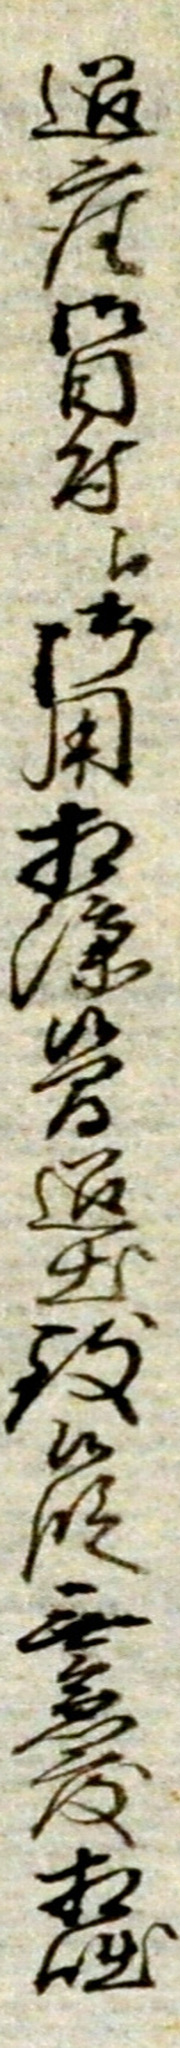退座御目付江御用相済候間退出致候段無急度相咄
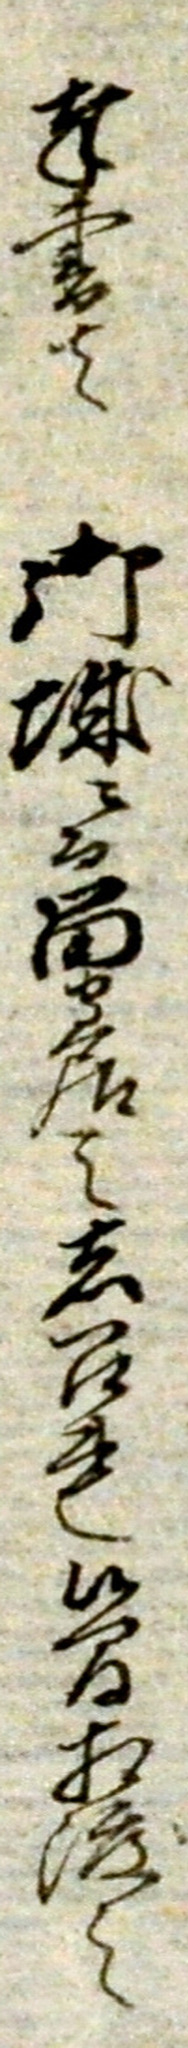奉書者御城ニ而留居之者召連候間相渡之
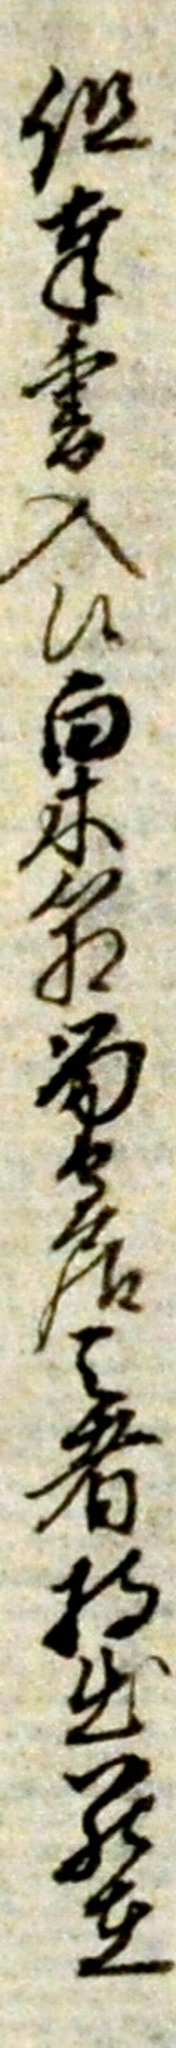但奉書入候白木箱留守居之者持出罷在
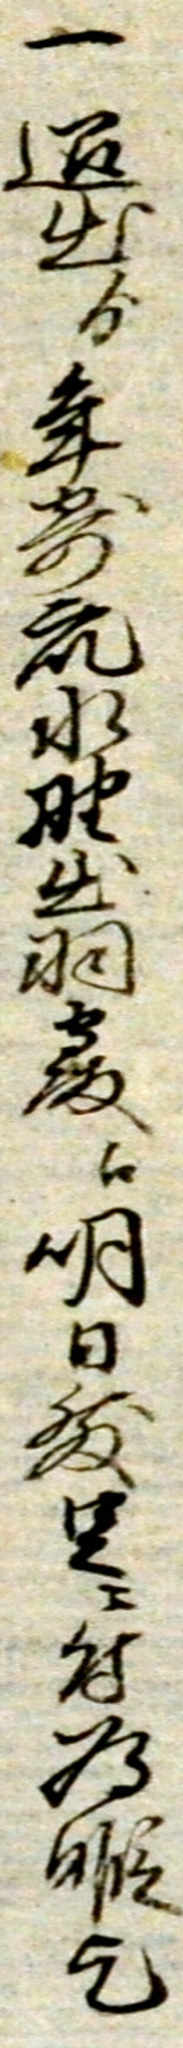一退出ゟ年寄衆水野出羽守殿江明日発足ニ付為暇乞
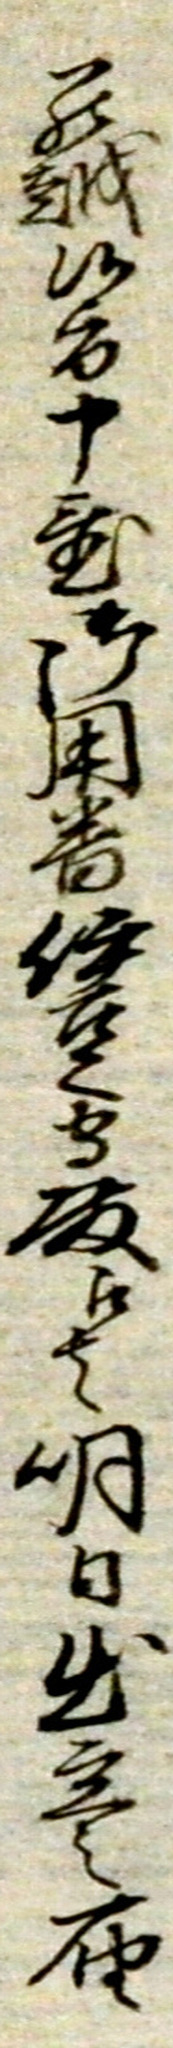罷越候旨申置御用番伊豆守殿江者明日出立之届
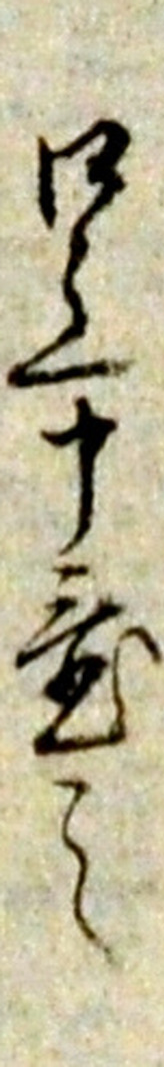口上申置之
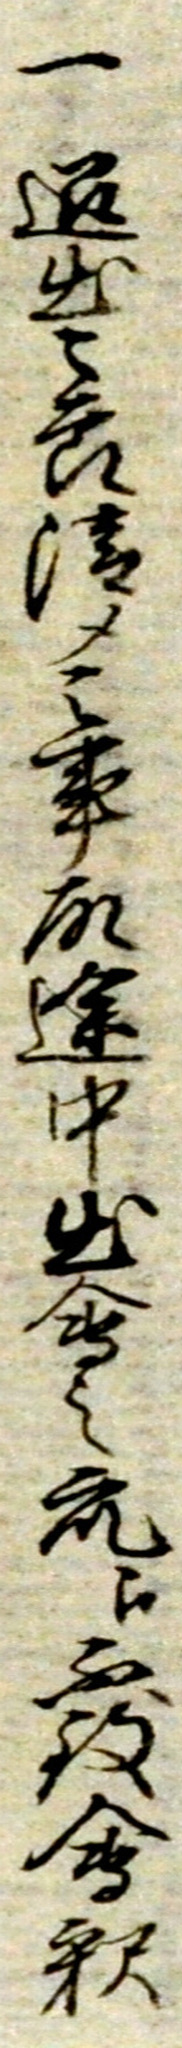一退出之節清メ之事故途中出会之衆江不致会釈
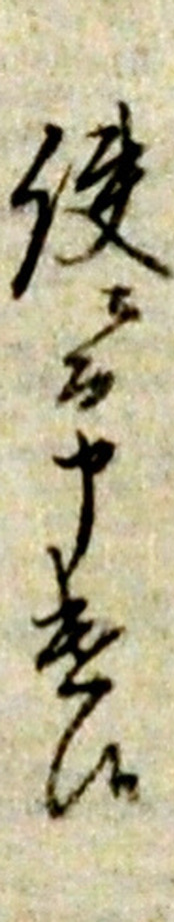使ニ而申遣候
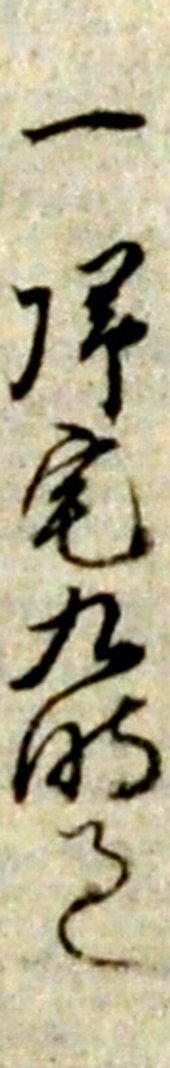一帰宅九時過
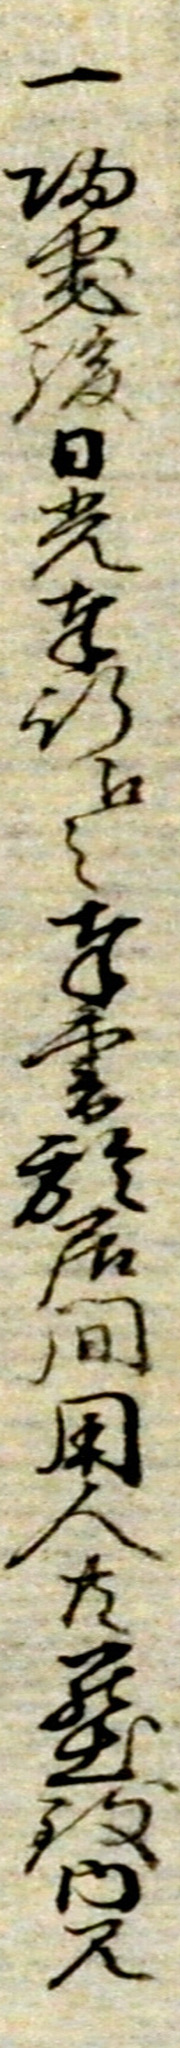一帰宅後日光奉行江之奉書於居間用人共罷出致内見
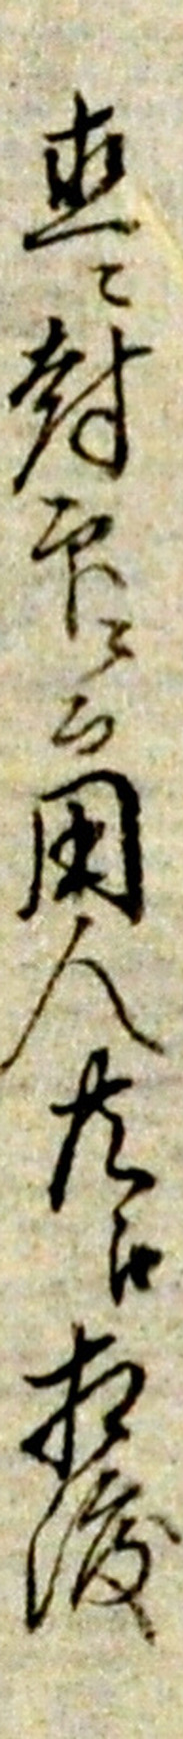直ニ封印ニ而用人共江相渡
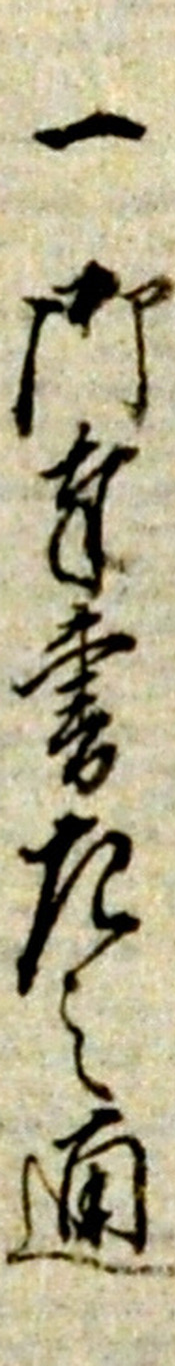一御奉書左之通
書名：日光御名代相勤候節ノ留
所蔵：伊那市立高遠町図書館・合同会社AMANE
